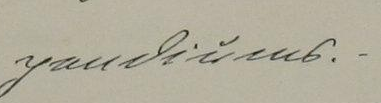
pendiums.
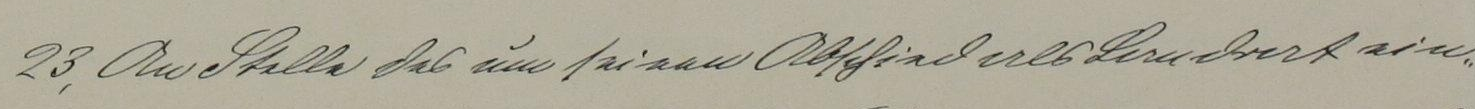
23. An Stelle des um seinen Abschied als Landrat ein-
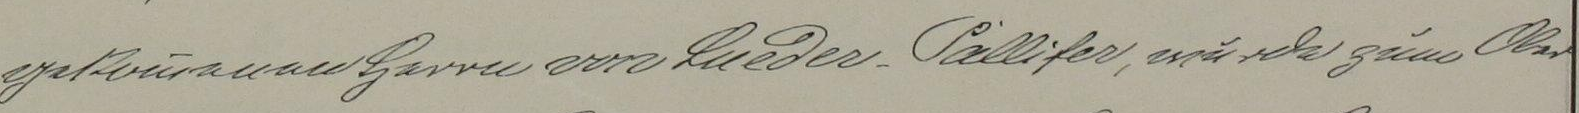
gekommenen Herrn von Lueder-Pallifer, wurde zum Ober-
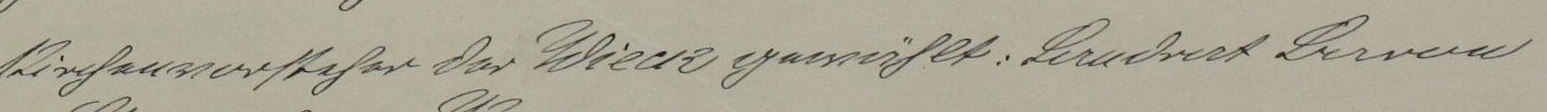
kirchenvorsteher der Wieck gewählt: Landrat Baron
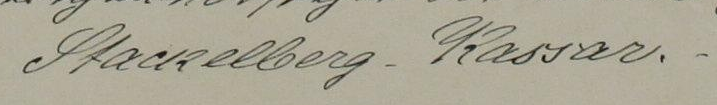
Stackelberg-Kassar.
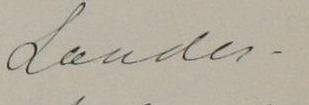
Landes-
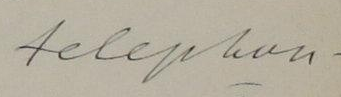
telephon-
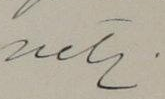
netz.
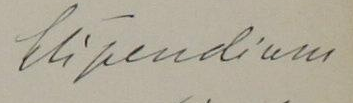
Stipendium
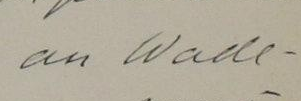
an Wade-
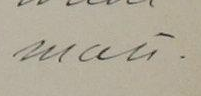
mann
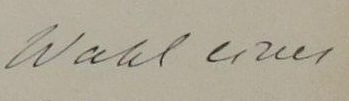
Wahl eines
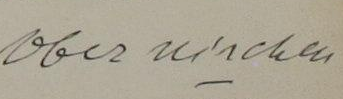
Oberkirchen
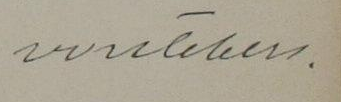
vorstehers.
